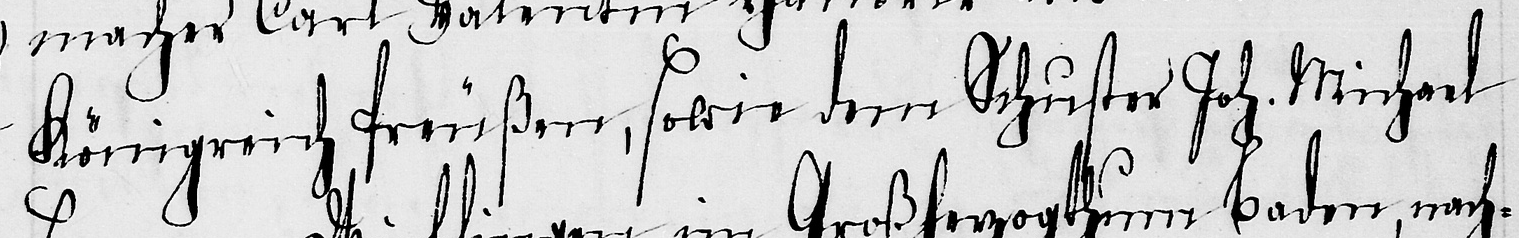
Königreich Preußen, sowie dem Schuster Joh. Michael
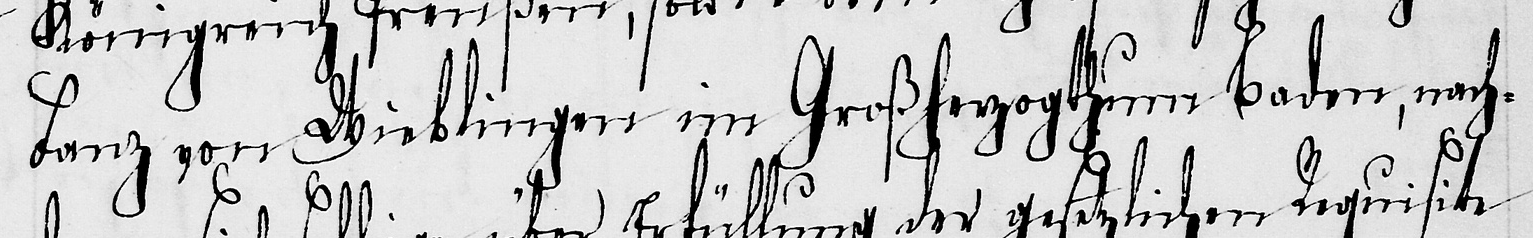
Fanz von Wieblingen im Großherzogthum Baden, nach¬
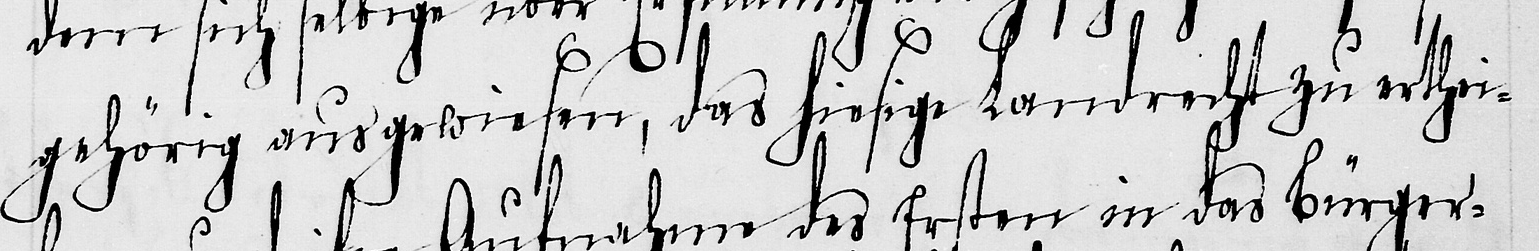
gehörig ausgewiesen, das hiesige Landrecht zu erthei¬
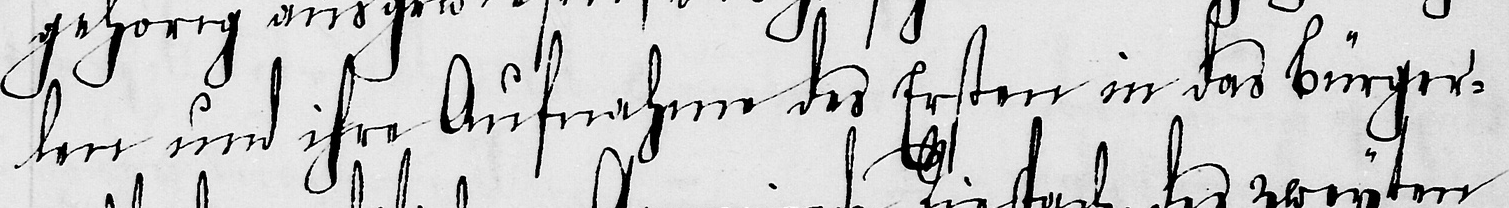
len und ihre Aufnahme des Ersten in das Bürger¬
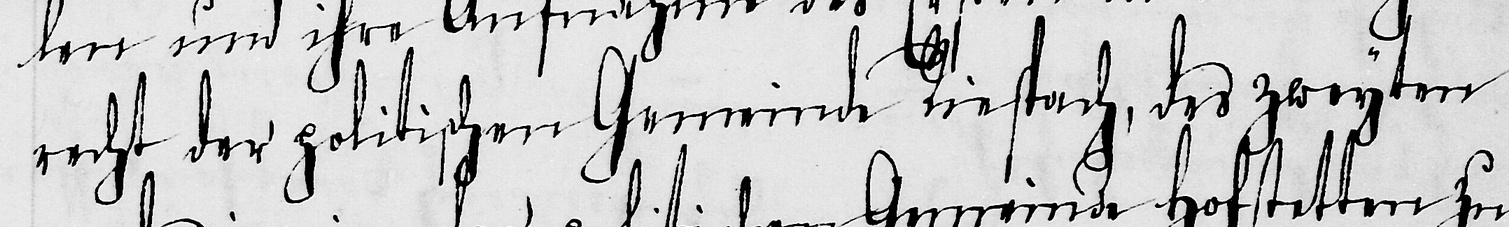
recht der politischen Gemeinde Riespach, des zweyten
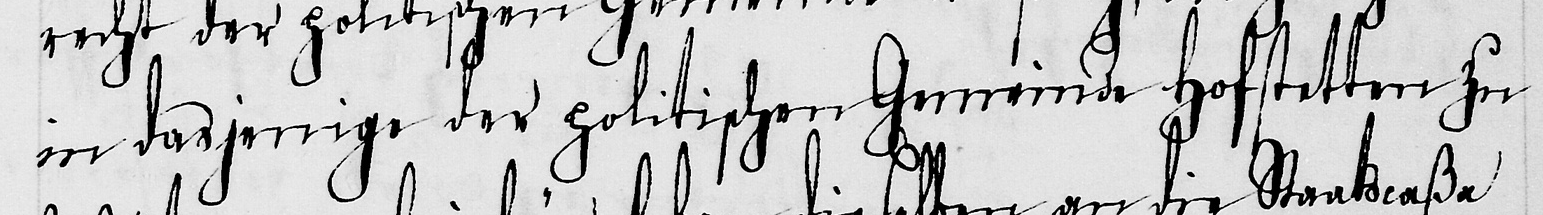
in dasjenige der politischen Gemeinde Hofstetten zu
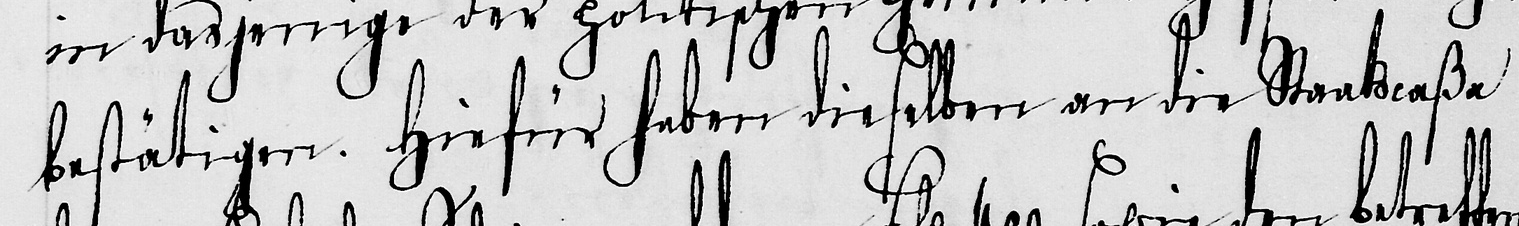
bestätigen. Hiefür haben dieselben an die Staatscaßa
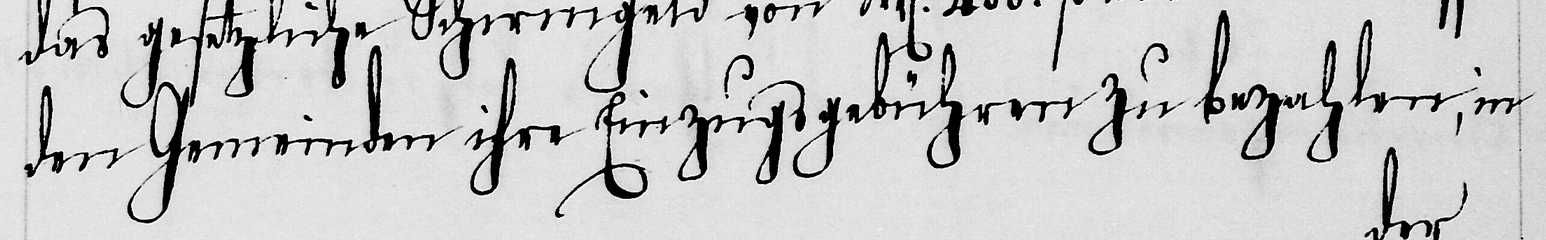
den Gemeinden ihre Einzugsgebühren zu bezahlen, in
